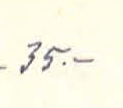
35.
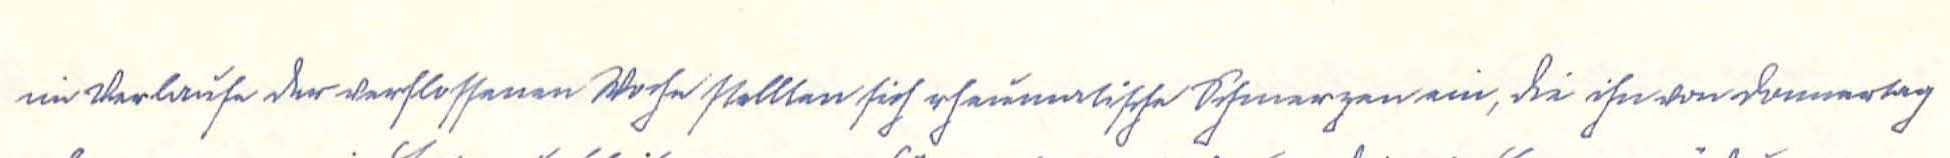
im Verlaufe der verflossenen Wochen stellten sich rheumatische Schmerzen ein, die ihn von Donnerstag
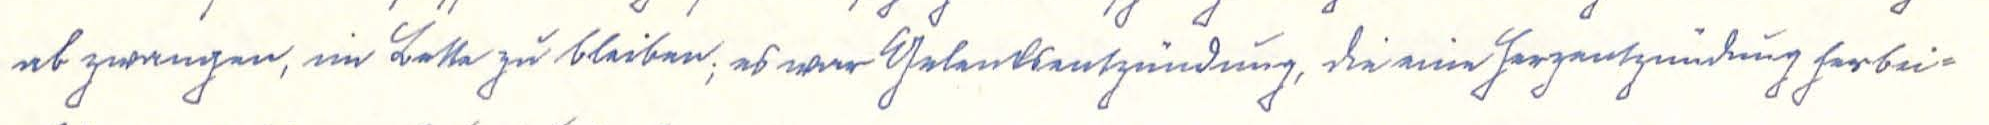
ab zwangen, im Bette zu bleiben, es war Gelenksentzündung, die eine Herzentzündung herbei-
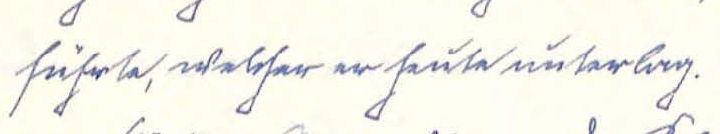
führte, welcher er heute unterlag.
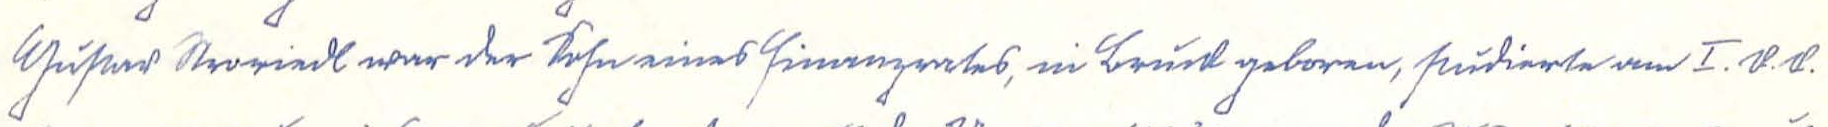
Gustav Stroriedl war der Sohn eines Finanzrates, in Bruck geboren, studierte am I. k.k.
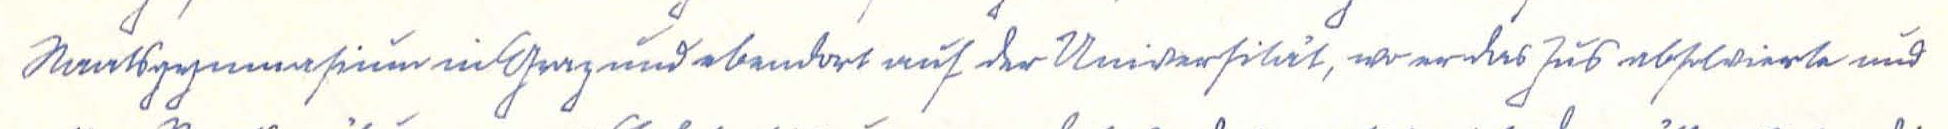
Staatsgymnasium in Graz und ebendort auf der Universität, wo er das Jus absolvierte und
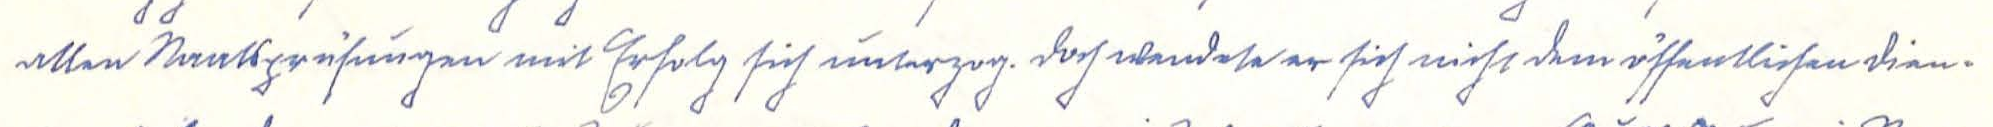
allen Staatsprüfungen mit Erfolg sich unterzog. Doch wendete er sich nicht dem öffentlichen Dien-
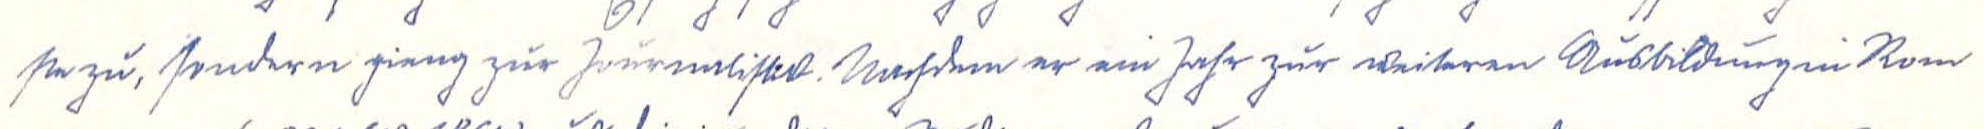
ste zu, sondern ging zur Journalistik. Nachdem er ein Jahr zur weiteren Ausbildung in Rom
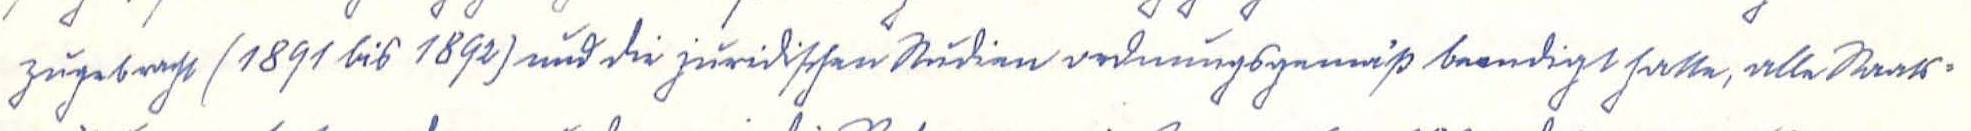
zugebracht (1891 bis 1892) und die juridischen Studien ordnungsgemäß beendigt hatte, alle Staats-
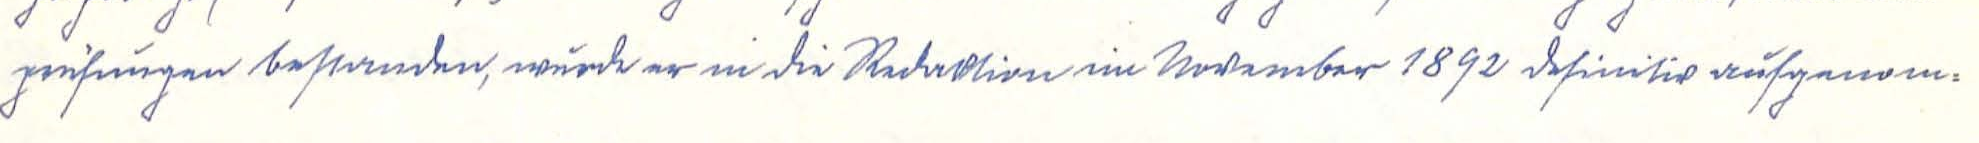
prüfungen bestanden, wurde er in die Redaktion im November 1892 definitiv aufgenom-
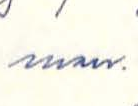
men.
